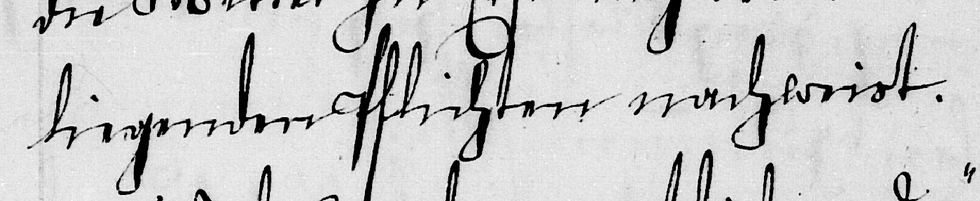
liegenden Pflichten nachweist.
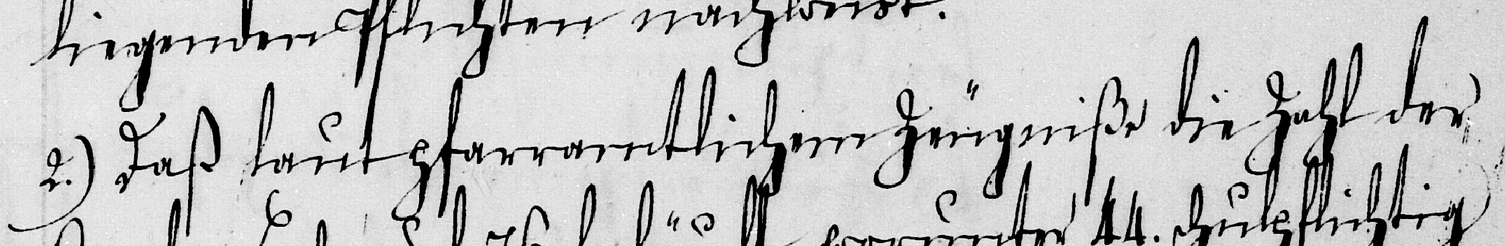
2.) Daß laut pfarramtlichem Zeugniße die Zahl der
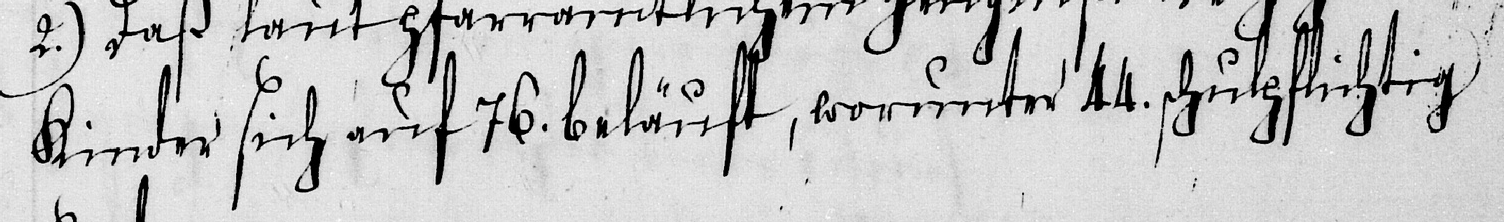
Kinder sich auf 76. beläuft, worunter 44. schulpflichtig
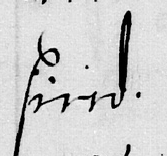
sind.
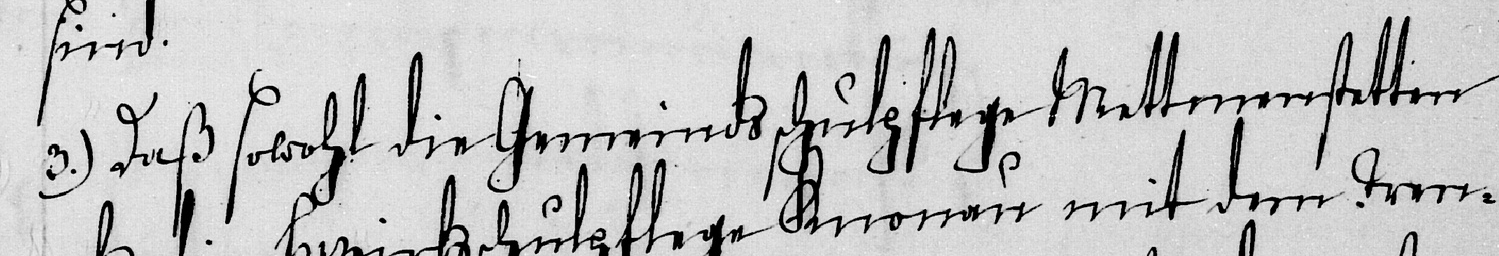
3.) Daß sowohl die Gemeindsschulpflege Mettmenstetten
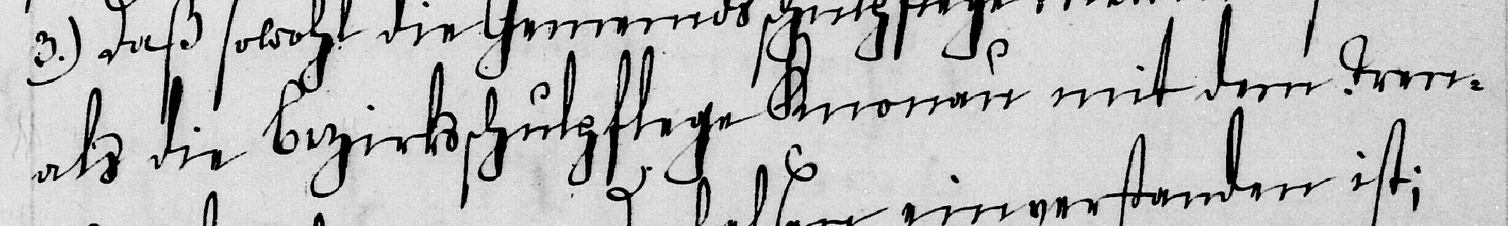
als die Bezirksschulpflege Knonau mit dem Tren¬
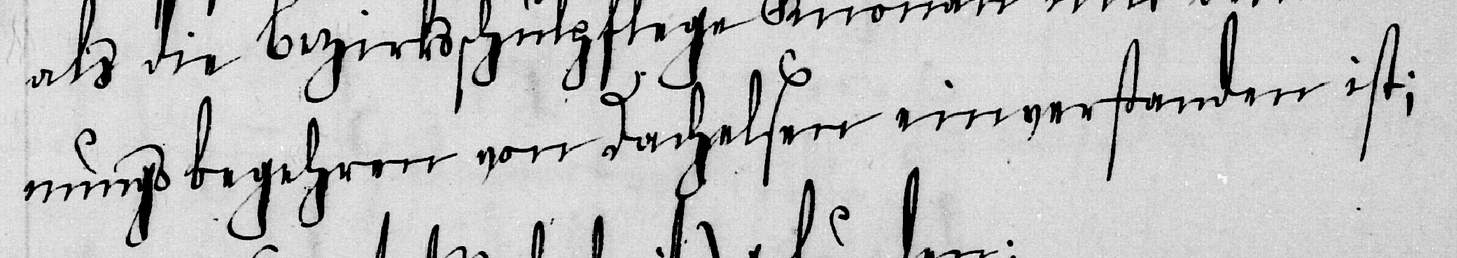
nungsbegehren von Dachelsen einverstanden ist;
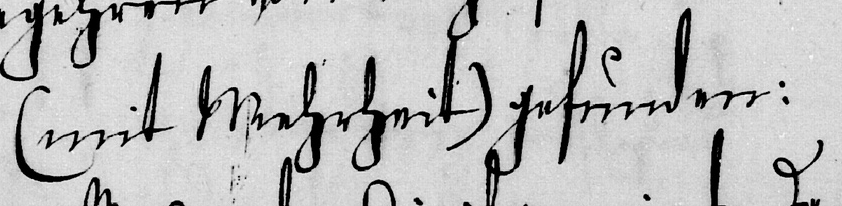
(mit Mehrheit) gefunden:
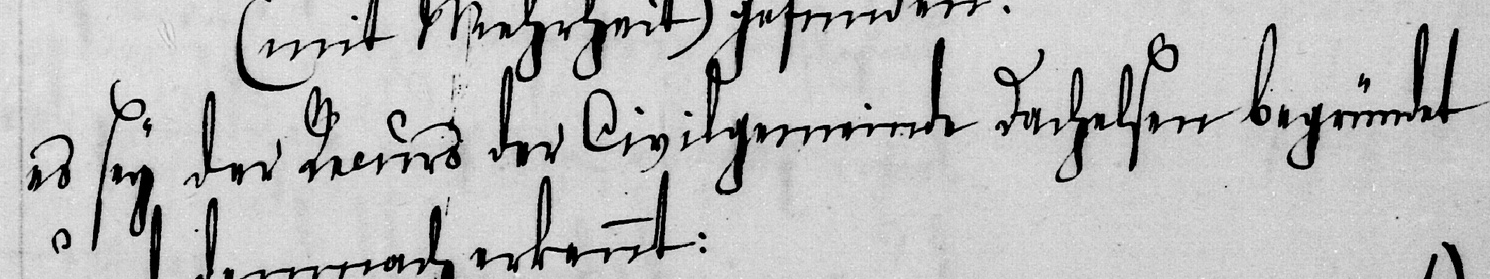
es sey der Recurs der Civilgemeinde Dachelsen begründet
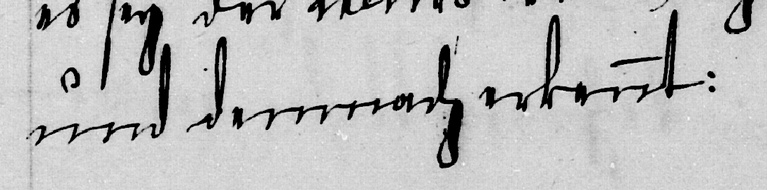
und demnach erkennt:
